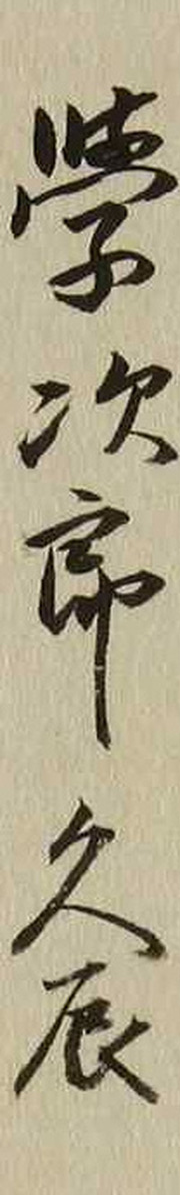学次郎久辰
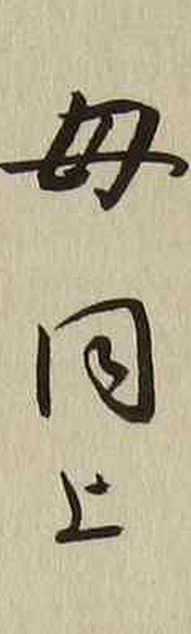母同上
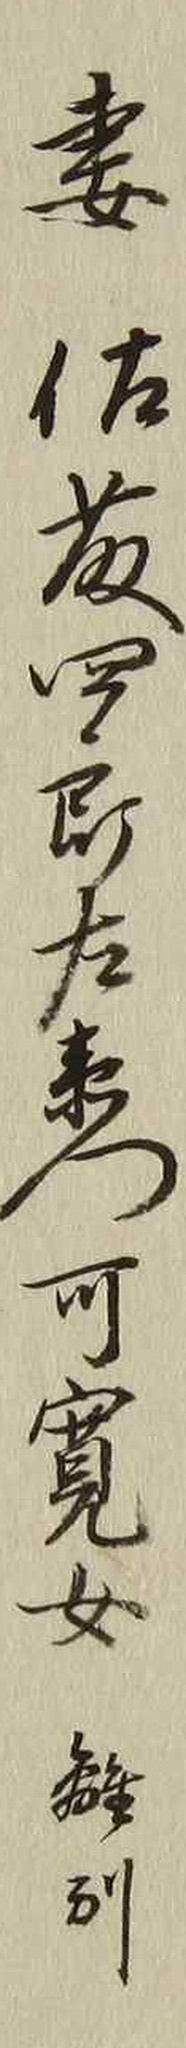妻佐藤四郎左衛門可寛女離別
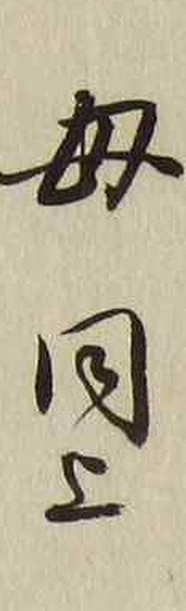母同上
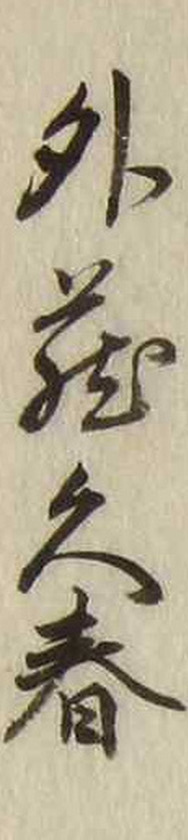外蔵久春

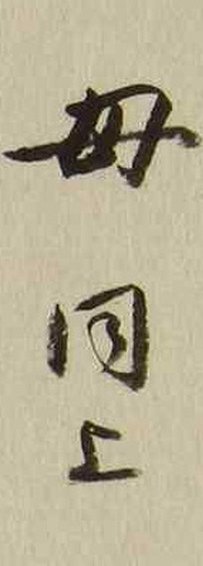母同上
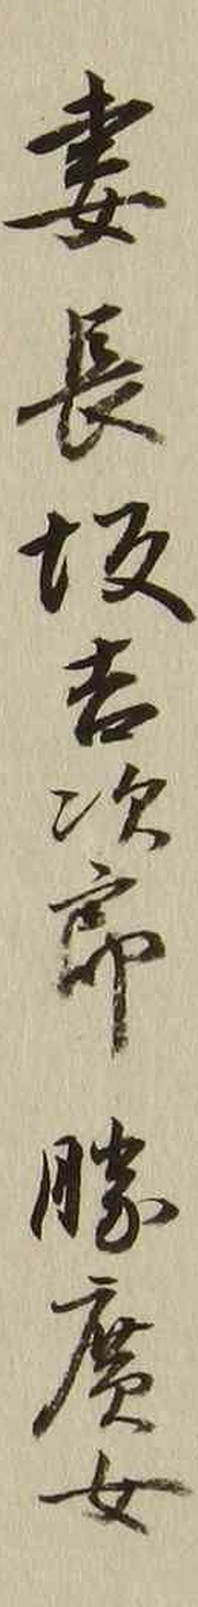妻長坂吉次郎勝広女
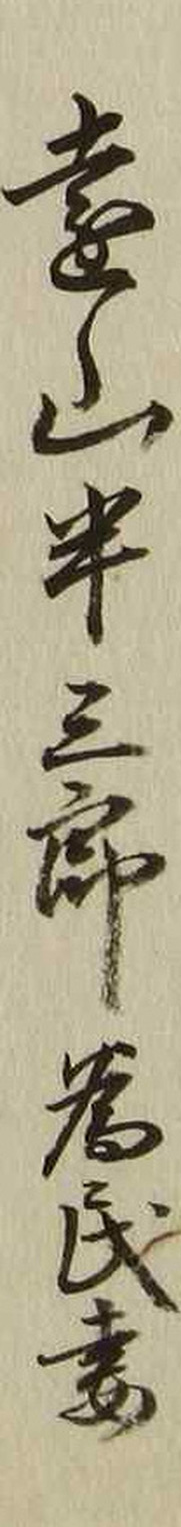女遠山半三郎為民妻
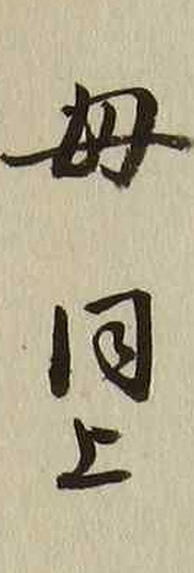母同上
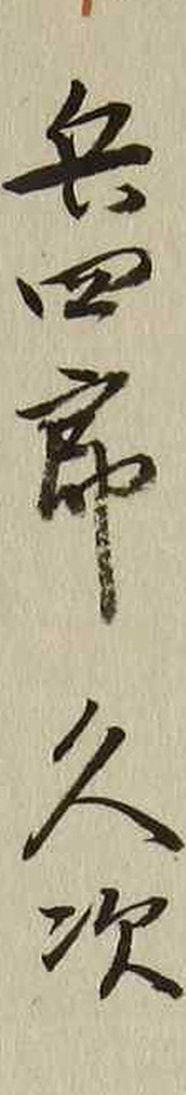兵四郎久次
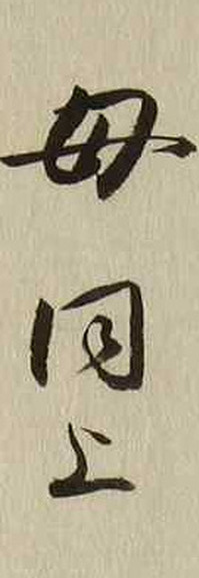母同上
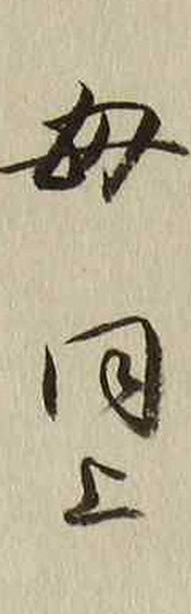母同上
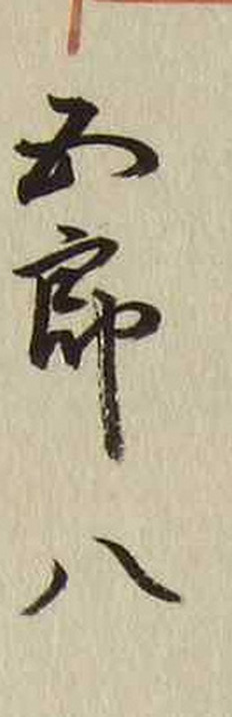五郎八
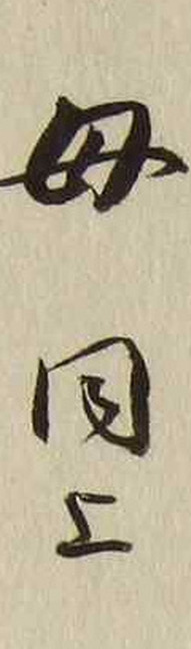母同上

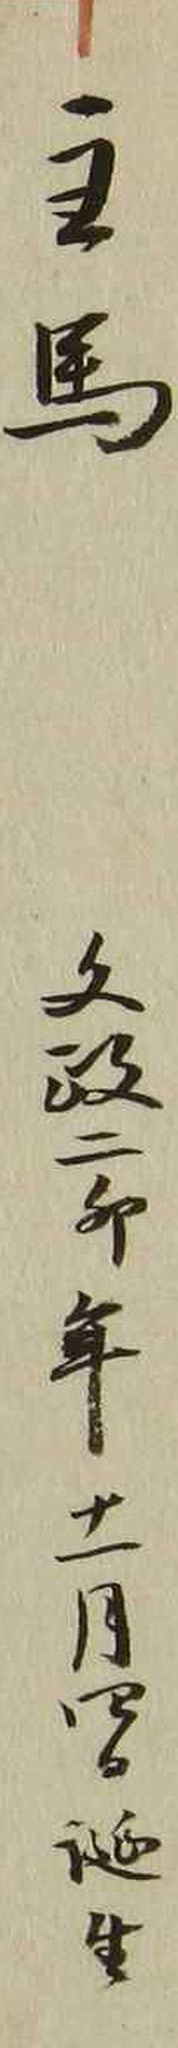主馬文政二卯年十一月四日誕生
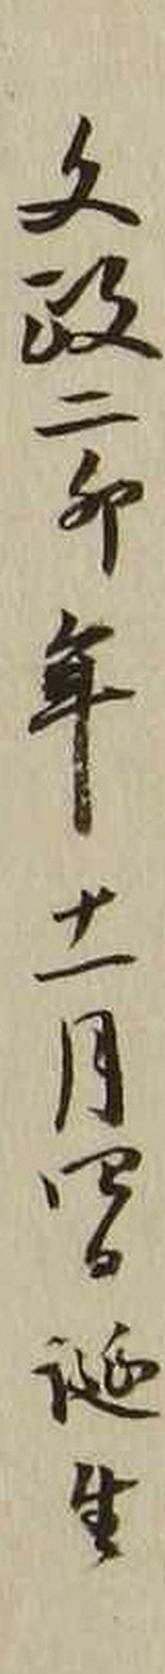主馬文政二卯年十一月四日誕生
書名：諸士系譜　巻之69　を之部3
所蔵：会津若松市立会津図書館
